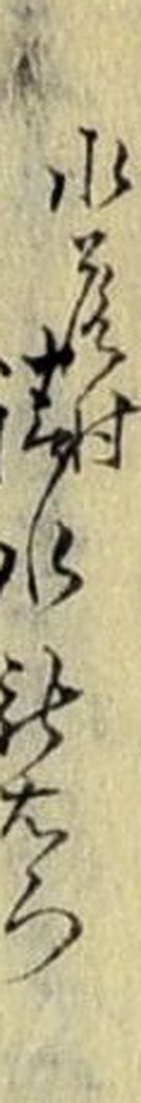清水新右衛門
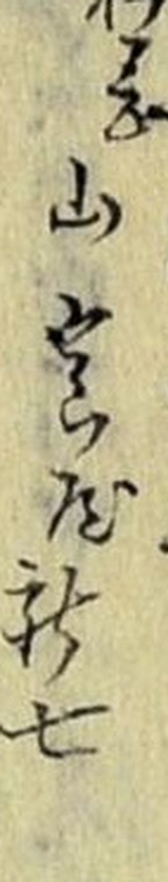山冨屋新七
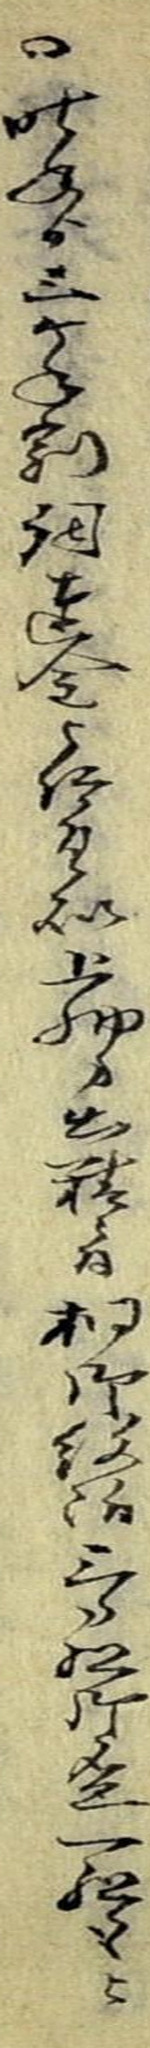○昨年ゟ三ヶ年割調達金被仰付候処上納方出精に付桐御紋附三ッ組御盃一組つヽ被
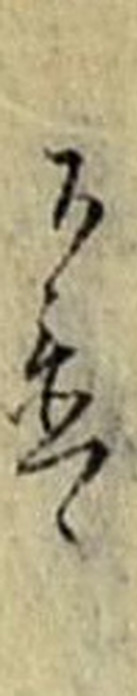下置候
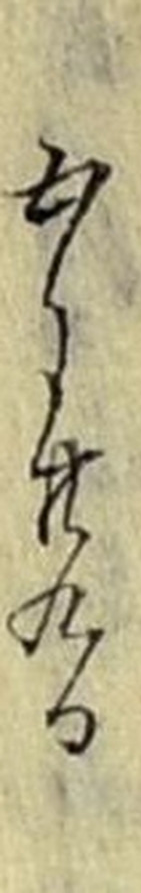五月廿九日
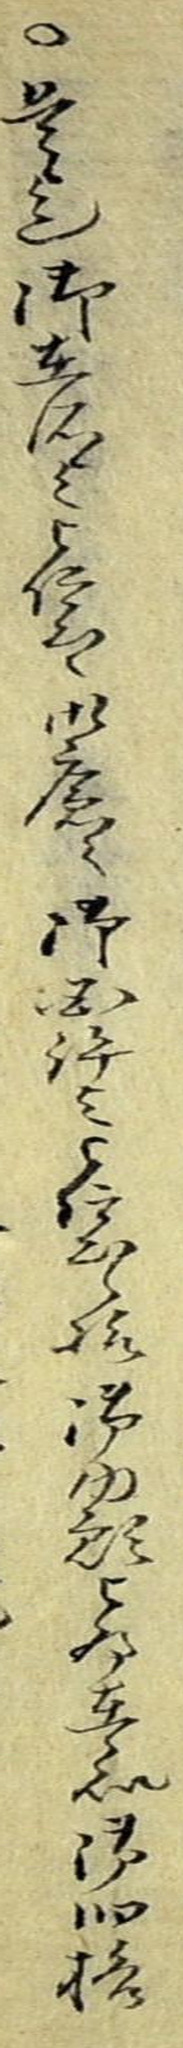○是迄御在所と被仰出候御廉々御国許と被仰出候様御内願被為在候処御旧格
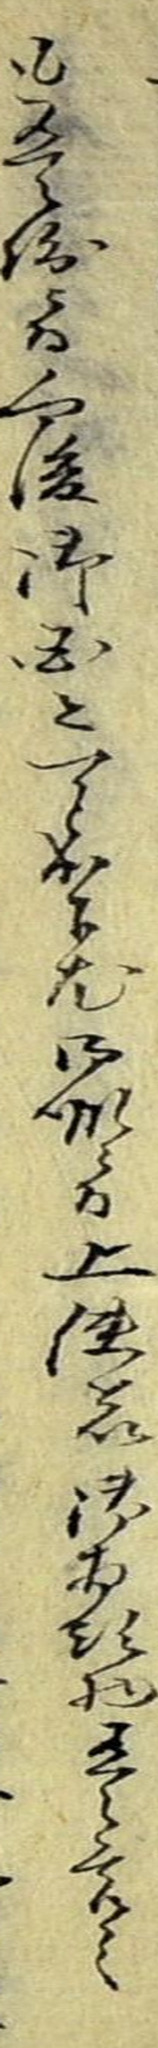も有之儀に付向後御国と可被成に候尤御暇に付上使を以御拝領物有之節之
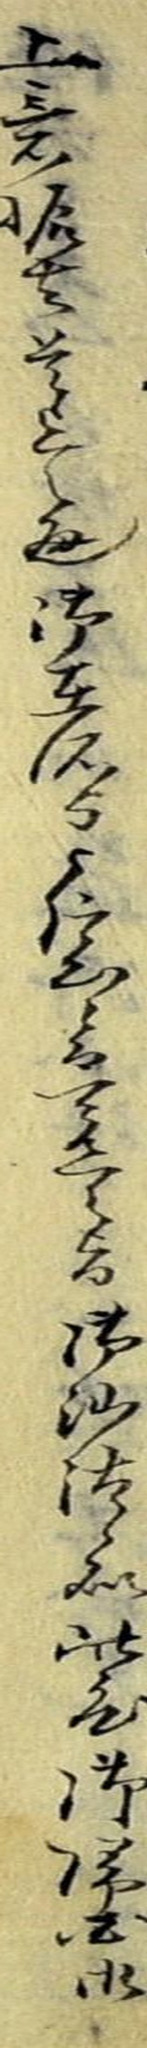上意振は是迄之通御在所と被仰出候而可有之旨御沙汰候処此度御帰国御

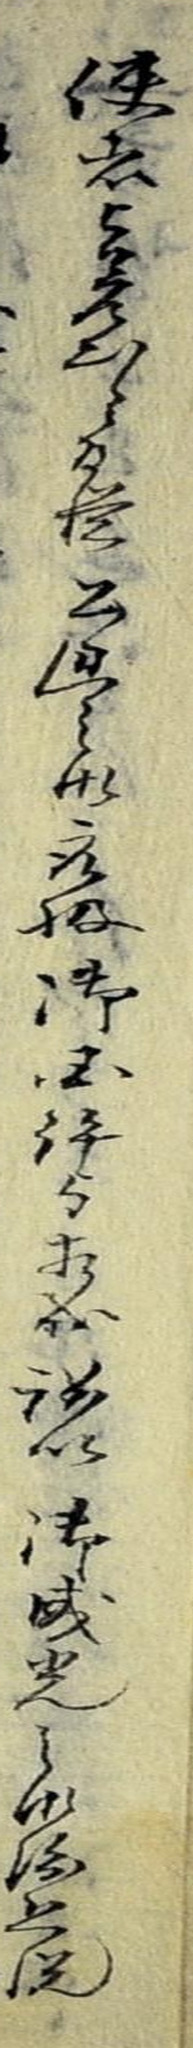使者被差出に付従公辺之御取扱御国許と相成誠以御威光之御儀恐悦
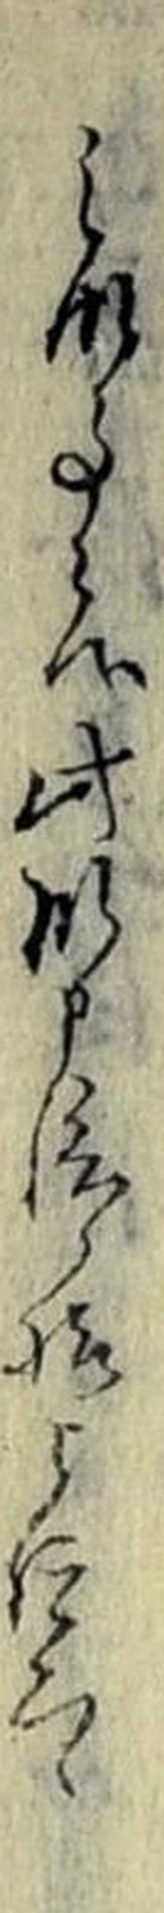之御事に候此段申渡候様被仰出候
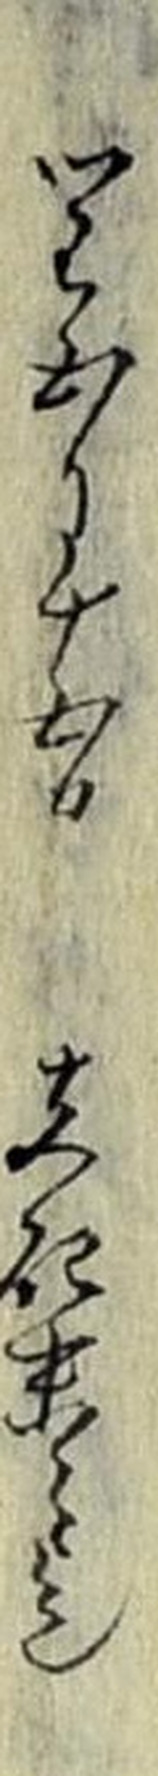閏五月十五日支配末々迄
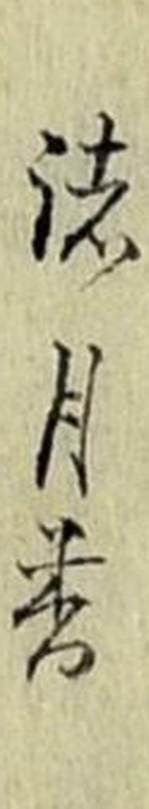諸月番
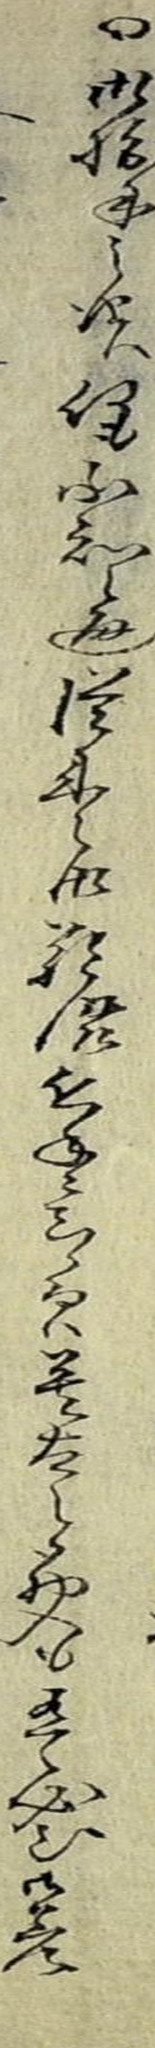○御勝手之儀は何も承知之通従來之御難渋近年に至候而は莫太之御物入も有之必至御差
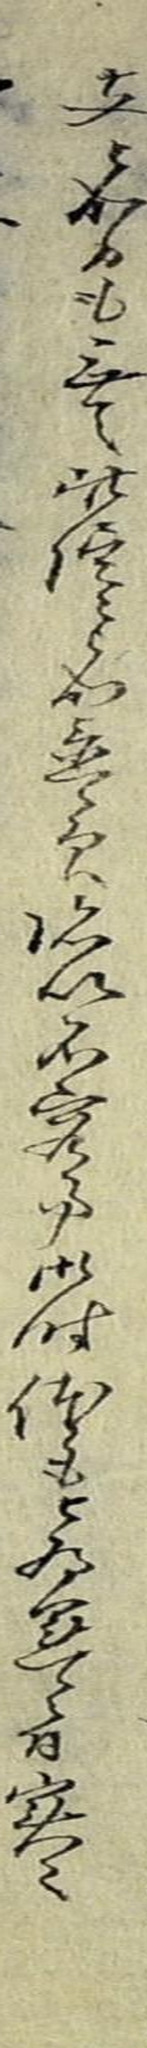支被成方も無之此侭に被成候而は弥以不容易御時体も被為運に付実々
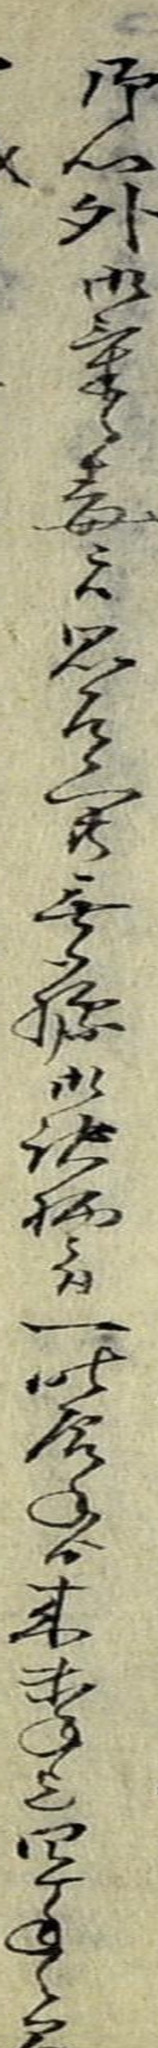御心外御気之毒には思召候へ共無御拠御訳柄に付一昨辰年ゟ来未年迄四ヶ年之間
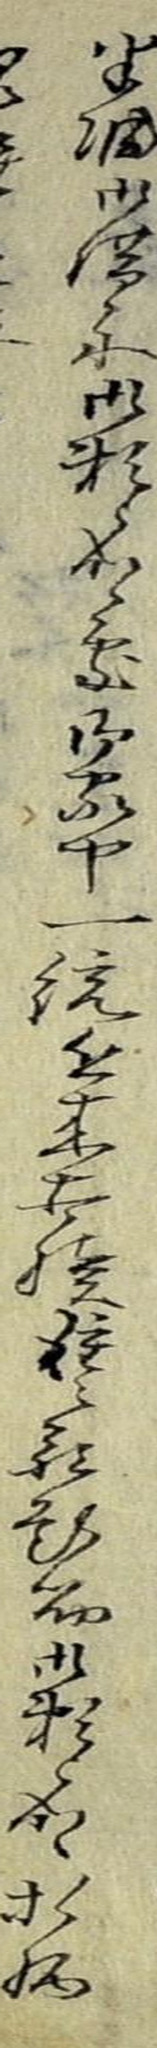半減御借米御頼被成候処御家中一統近来打続種々難題筋御頼被成候折柄
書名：命令之部 六
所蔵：福井県文書館 Fukui Prefectural Archives
